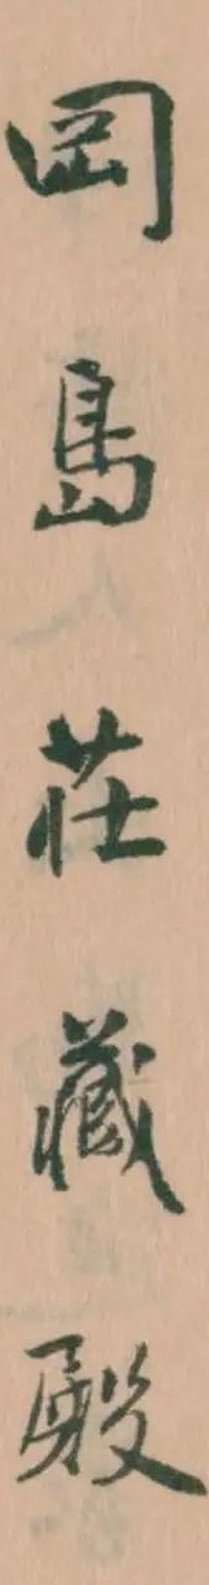岡島荘藏殿
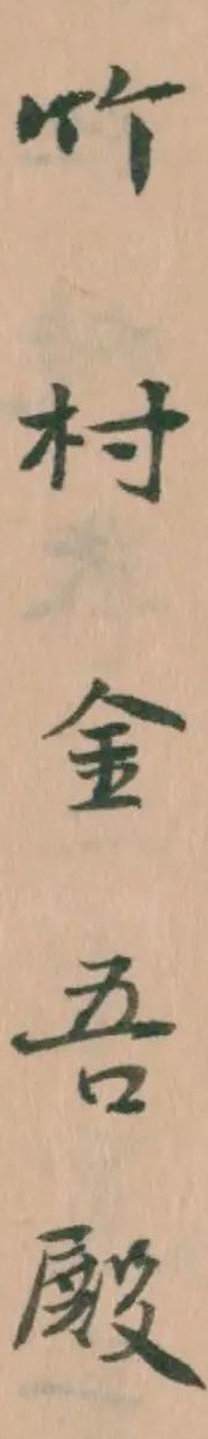竹村金吾殿
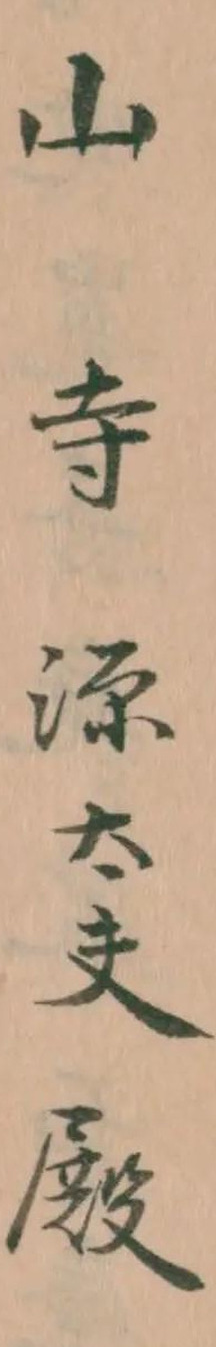山寺源太夫殿
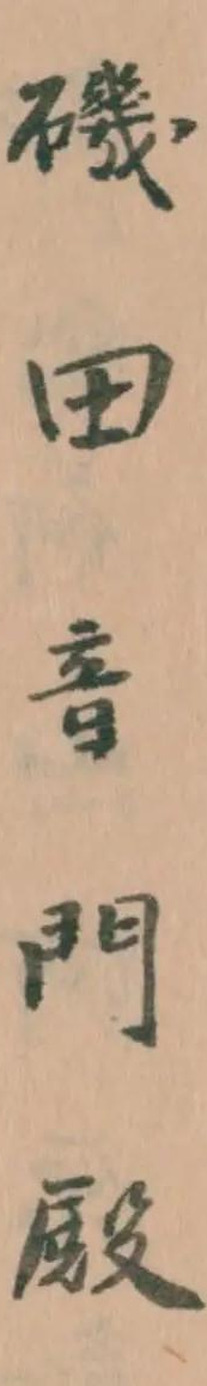磯田音門殿
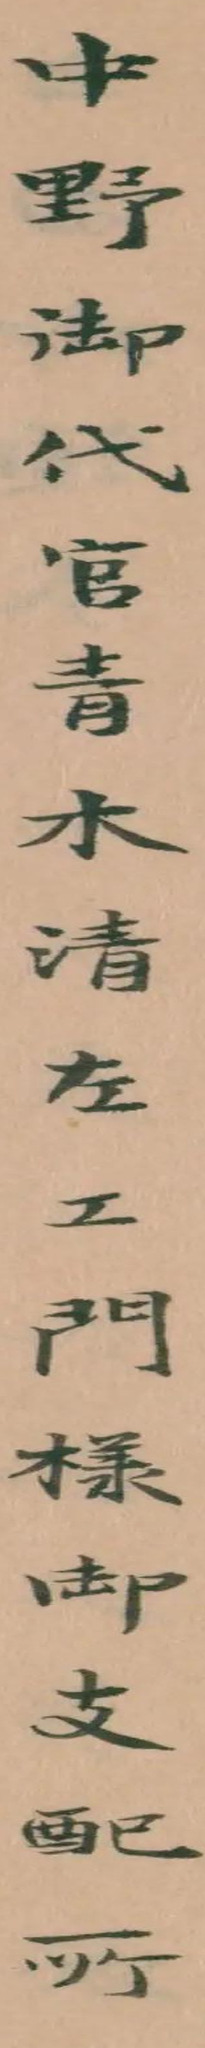中野御代官青木清左エ門様御支配所
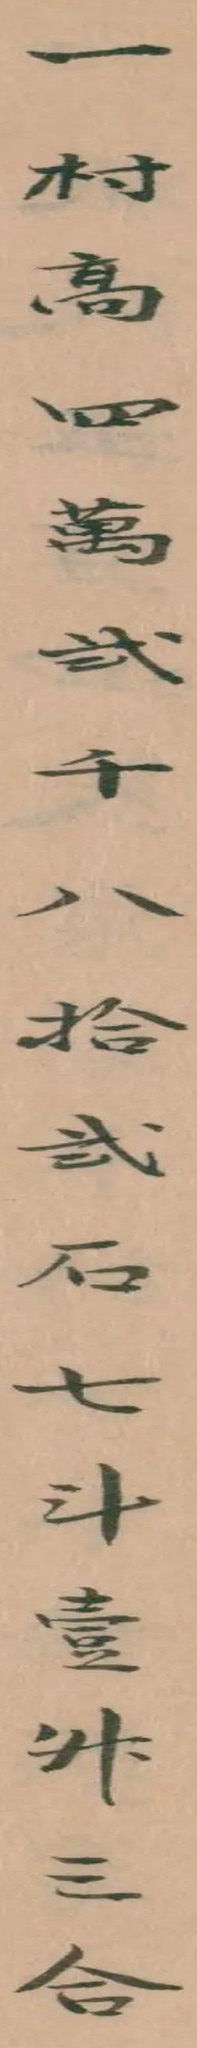一村高四萬弐千八拾弐石七斗壹升三合
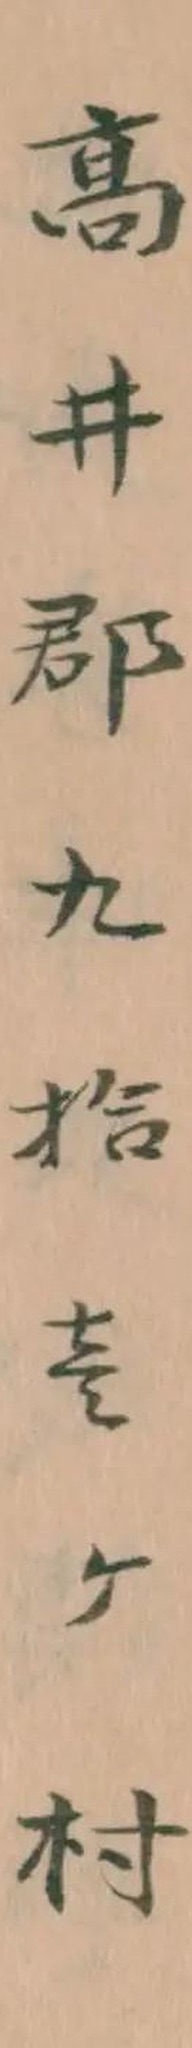高井郡九拾壱ケ村
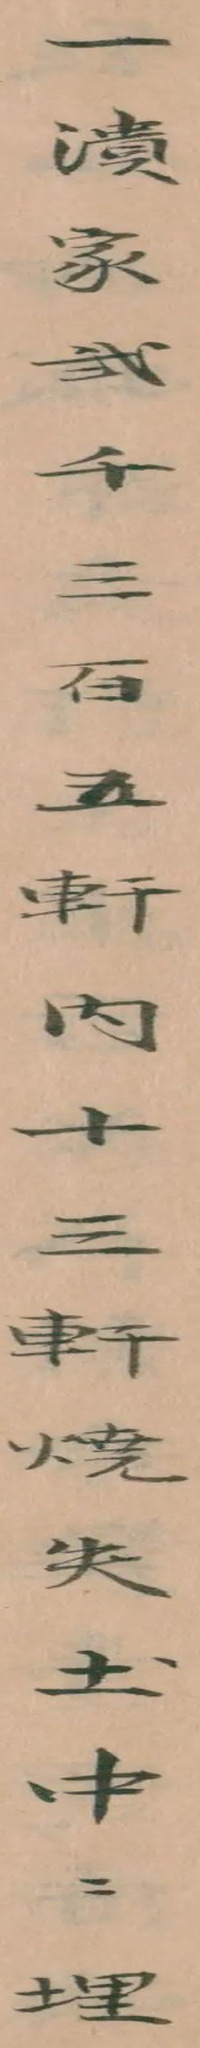一潰家弐千三百五軒内十三軒焼失土中ニ埋
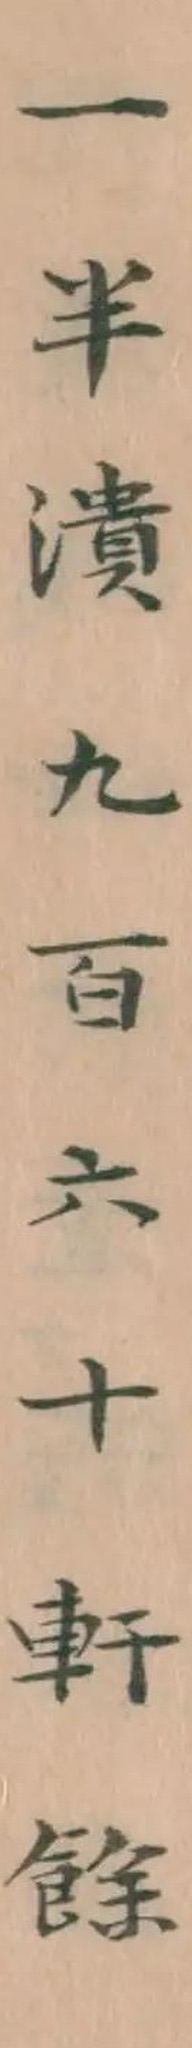一半潰九百六十軒余
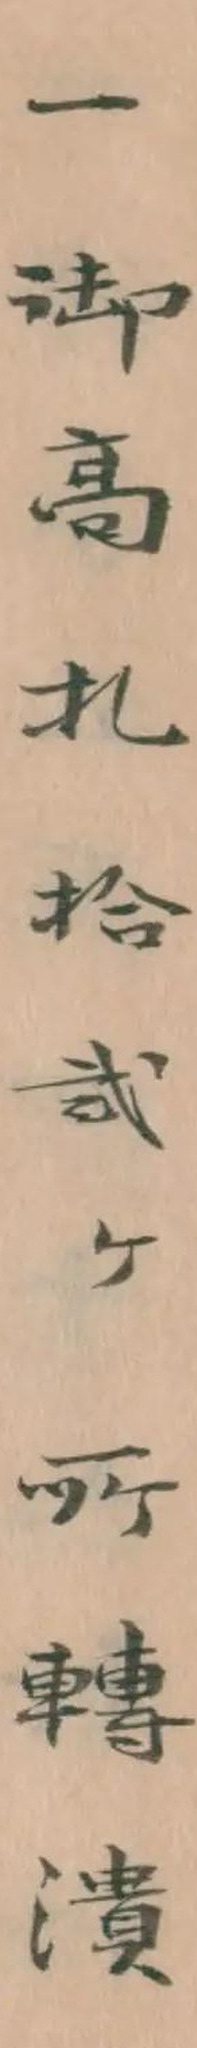一御高札拾弐ケ所転潰
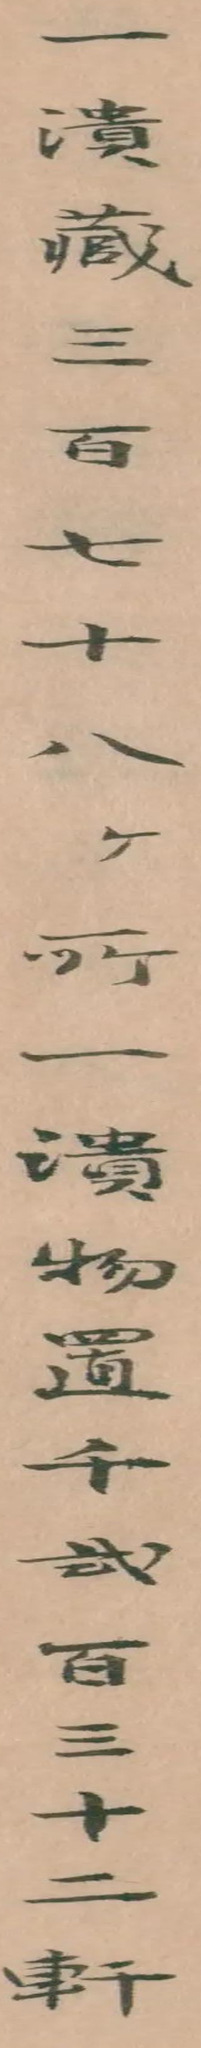一潰藏三百七十八ケ所一潰物置千弐百三十二軒
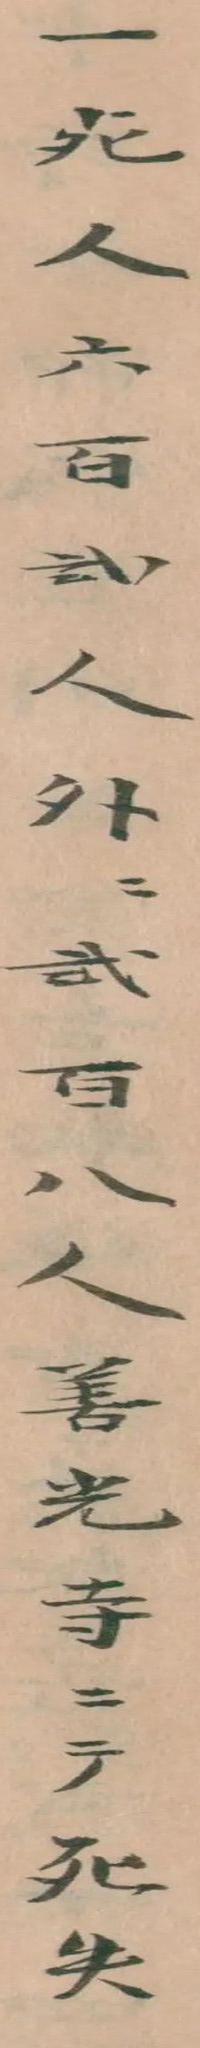一死人六百弐人外ニ弐百八人善光寺ニテ死失
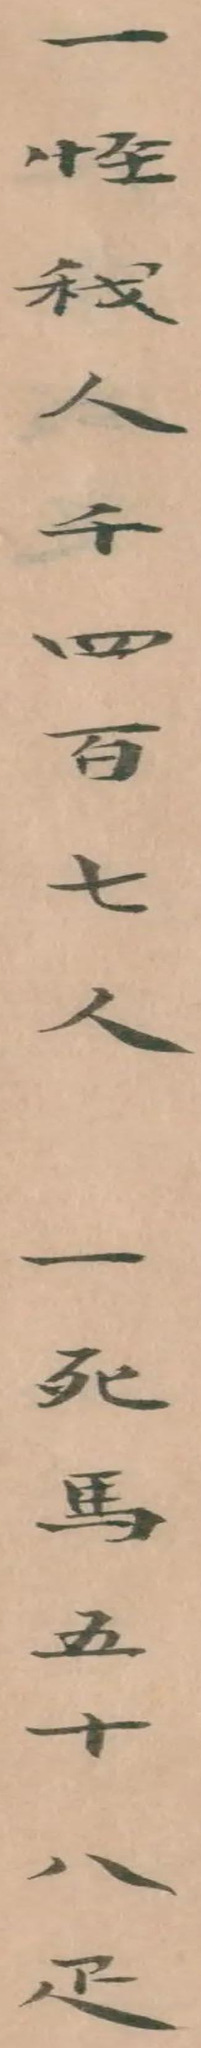一怪我人千四百七人一死馬五十八疋

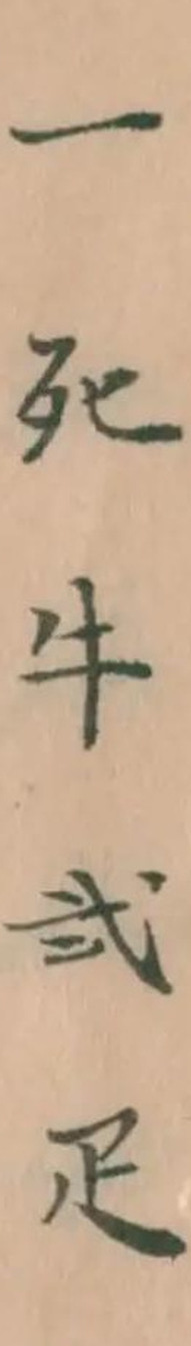一死牛弐疋
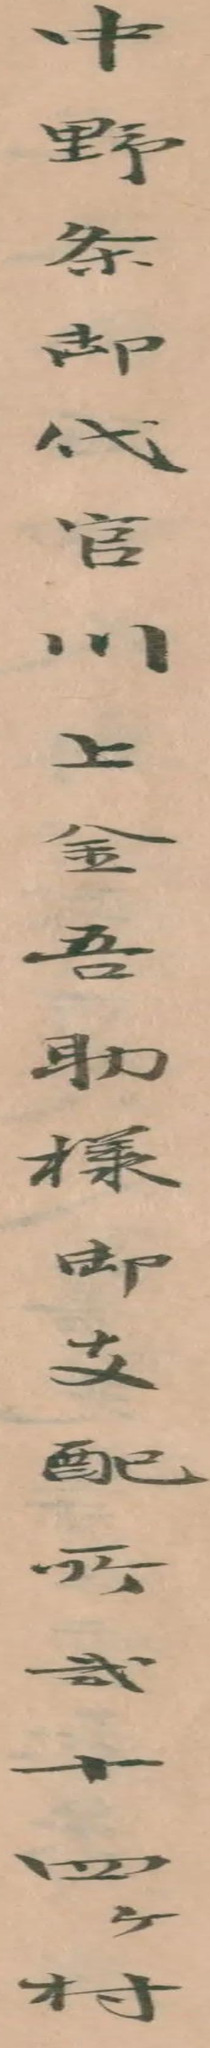中野条御代官川上金吾助様御支配所弐十四ケ村
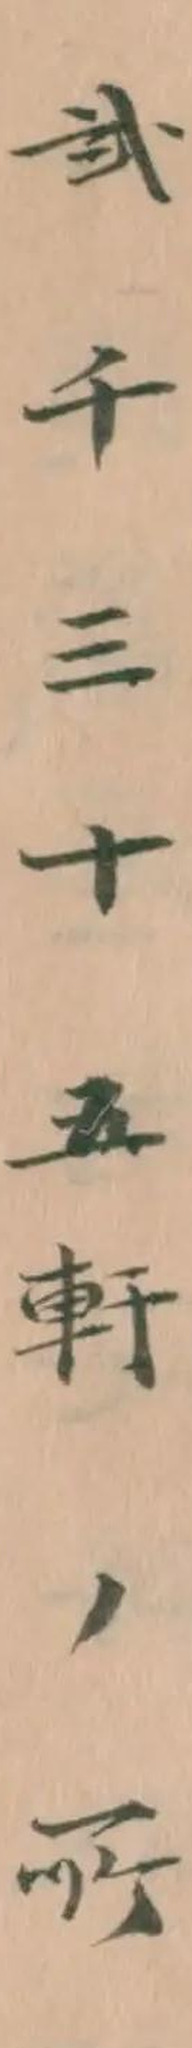弐千三十五軒ノ所
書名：地災撮要. 巻5-6(地震之部)
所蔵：国立国会図書館 National Diet Library, JAPAN
